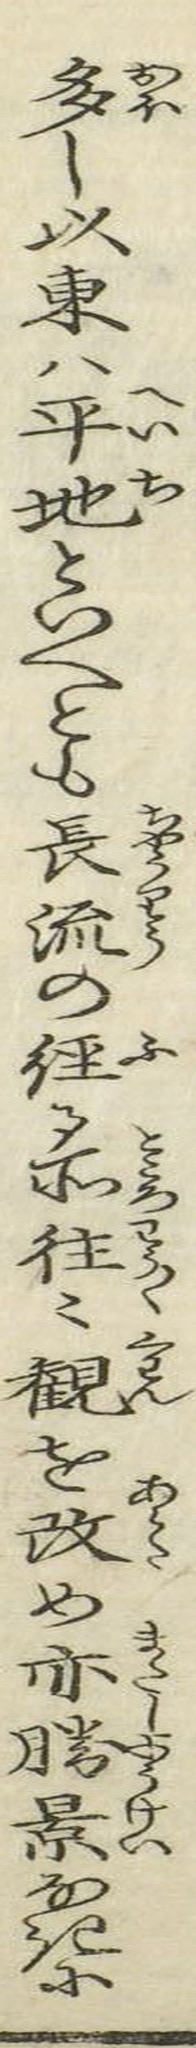多し以東は平地といへとも長流の経る所往々観を改め亦勝景なきに
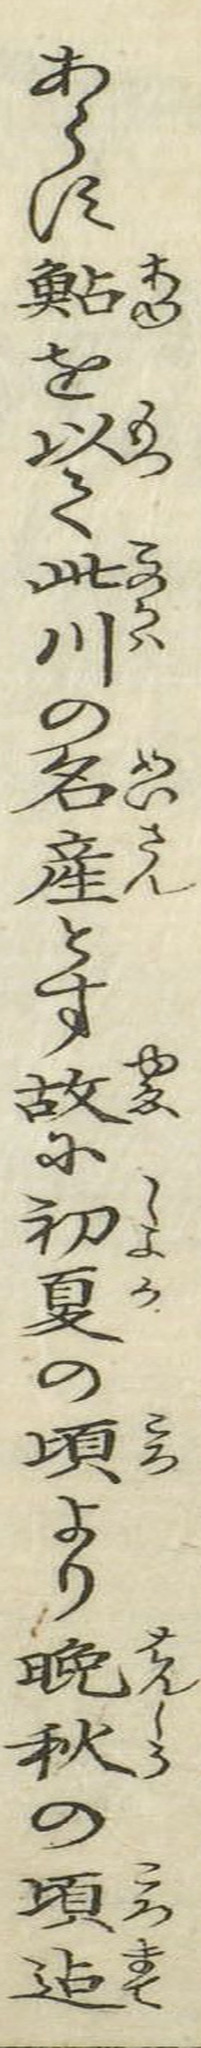あらす鮎を以て此川の名産とす故に初夏の頃より晩秋の頃迠
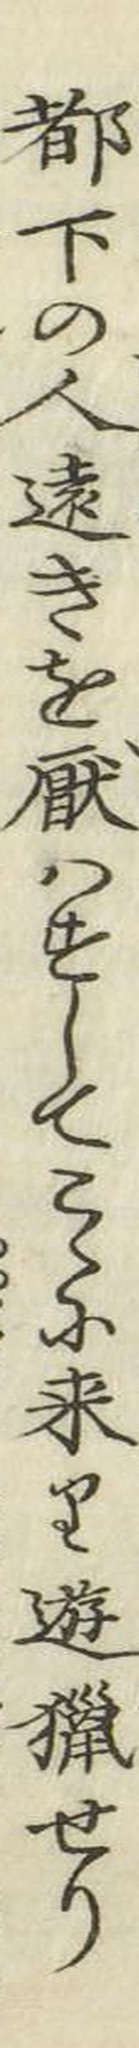都下の人遠きを厭はすしてこゝに来り遊猟せり
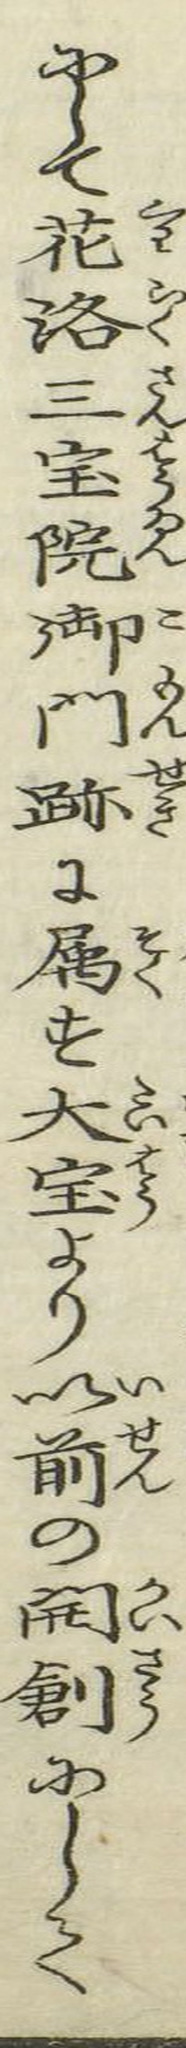にして花洛三宝院御門跡に属す大宝より以前の開創にして
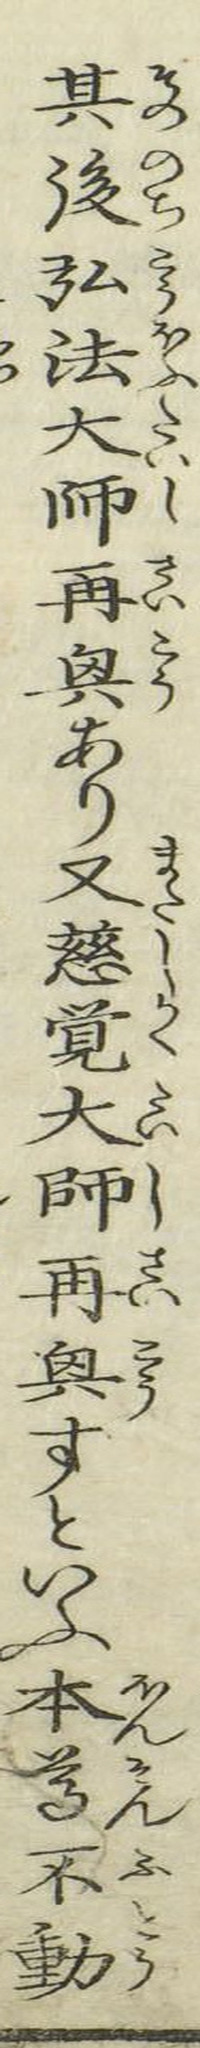其後弘法大師再興あり又慈覚大師再興すといふ本尊不動

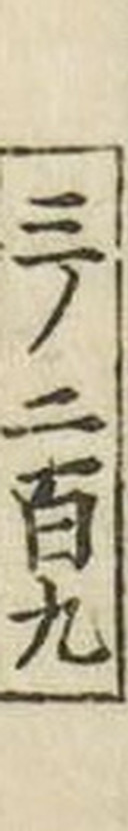三ノ二百九
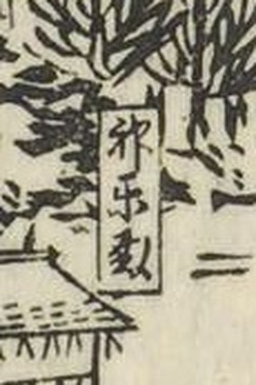神楽殿
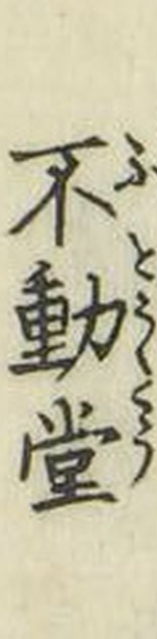不動堂

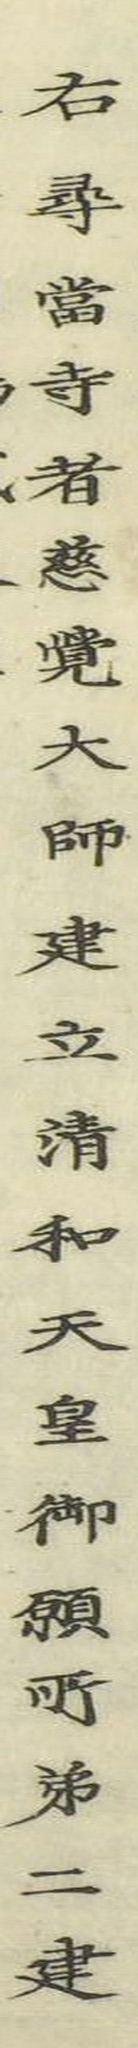右尋当寺者慈覚大師建立清和天皇御願所弟二建
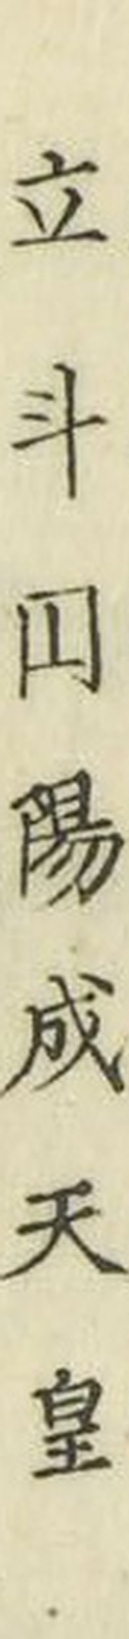立斗円陽成天皇
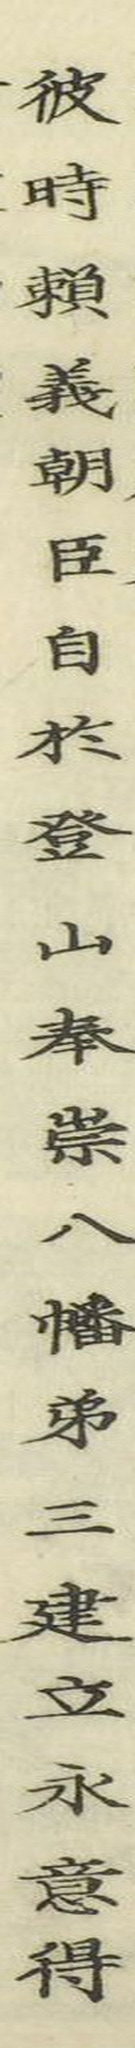彼時頼義朝臣自於登山奉崇八幡弟三建立永意得
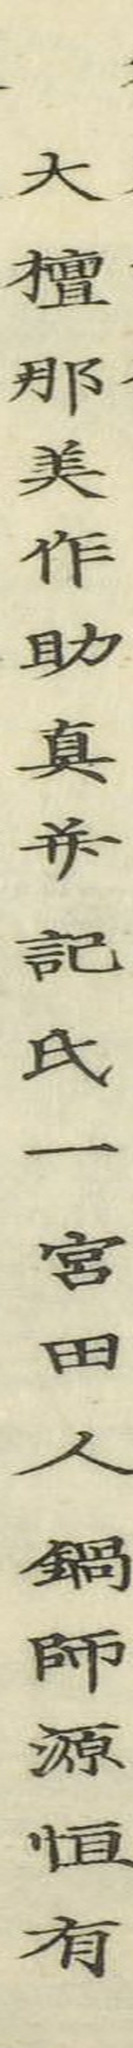大檀那美作助真并記氏一宮田人鍋師源恒有
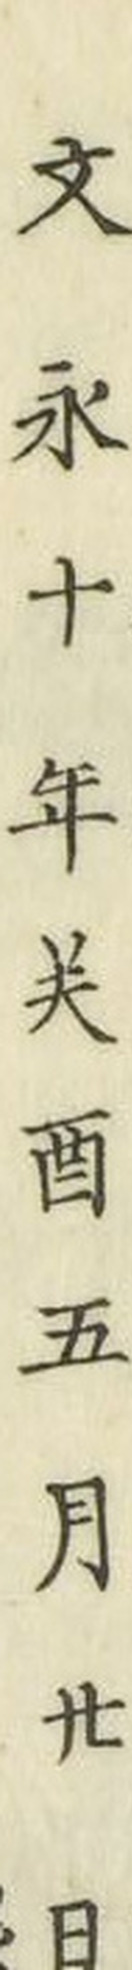文永十年癸酉五月廿日
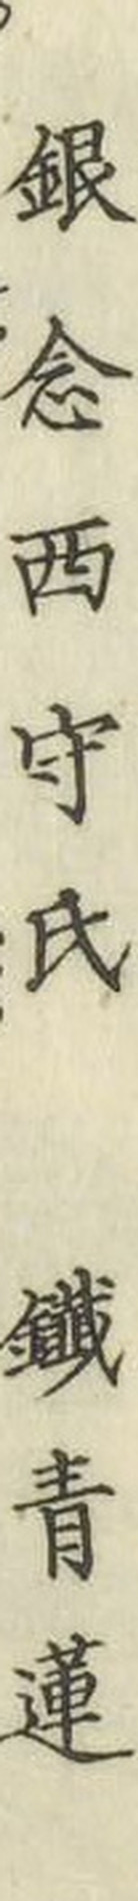銀念西守氏鑯青蓮
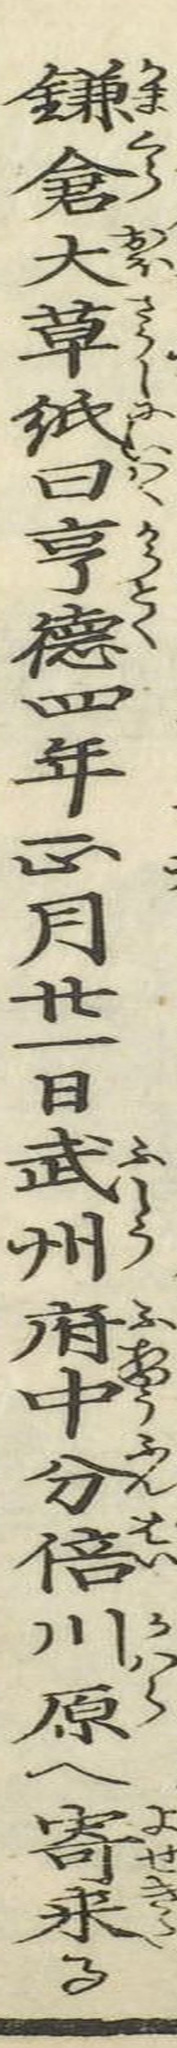鎌倉大草紙曰享徳四年正月廿一日武州府中分倍川原へ寄来る
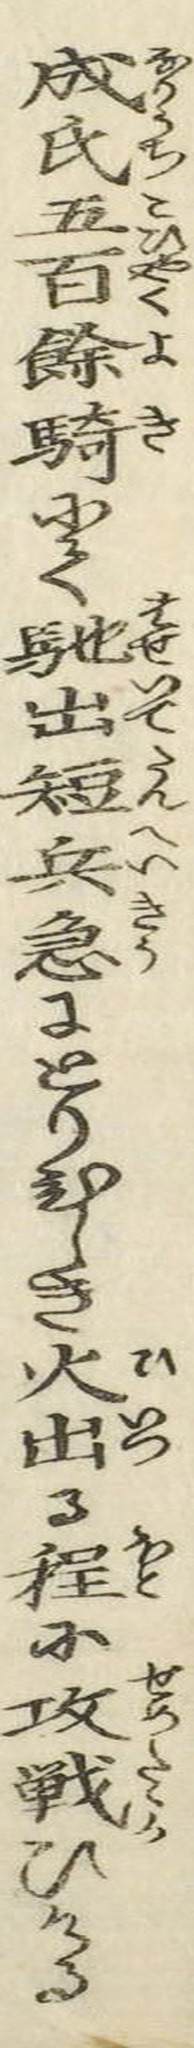成氏五百余騎にて馳出短兵急にとりひしき火出る程に攻戦ひける
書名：江戸名所図会 20巻 巻之10
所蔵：東京学芸大学教育コンテンツアーカイブ
